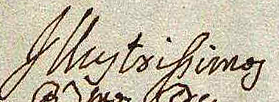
Jllustrissimos
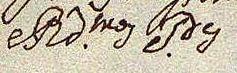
e Rd.mos S.res
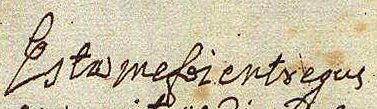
Esta me foi entregue
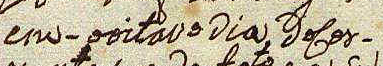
em - o oitavo dia do Cor
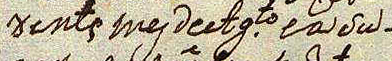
rente mes de Ag.to e a su
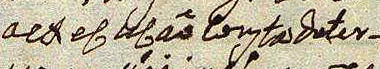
a execuçaõ consta do ter
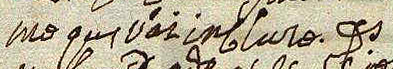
mo que vai incluzo. D.s
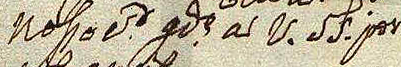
nosso s.or g.de a V. SS. por
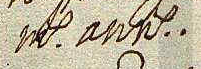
m.o ann.s.
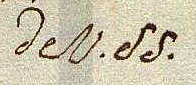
de V. SS.
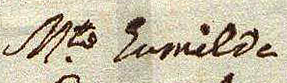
M.to humilde
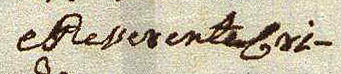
e Reverente Cri
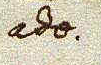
ado.
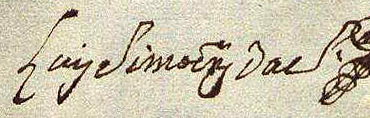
Luis Simoen̄s da S.a
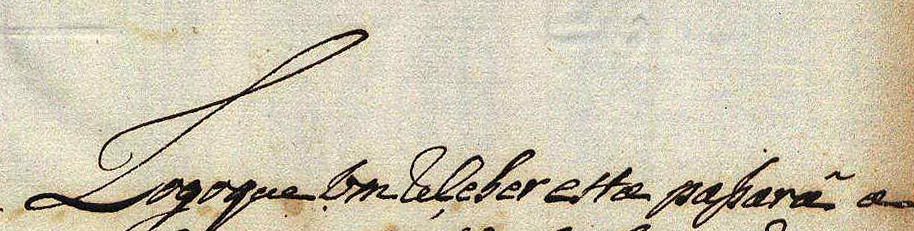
Logo que v m ReÇeber esta passará a
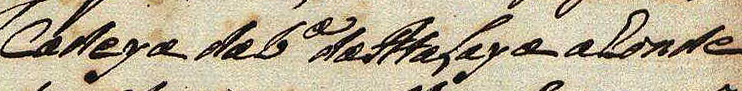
Cadeya da V.a da AtaLaya ahonde
